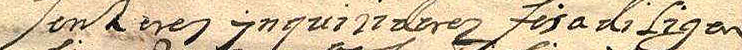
Senhores jnquizidores fis a diligen
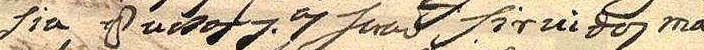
sia q̄ uosas s.as foraõ siruidos ma
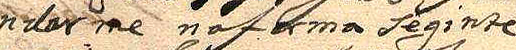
ndar me na forma seginte.
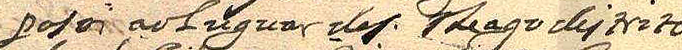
pasei ao Luguar de S. Thiago distrito
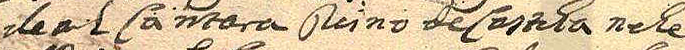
de aLCantara Reino de Castela nele
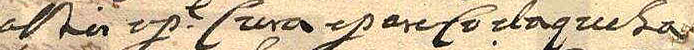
achei o pe. Cura e paroCo daqueLa
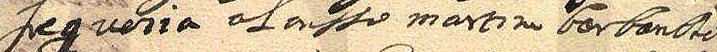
freguesia aLonsso martim barbanste
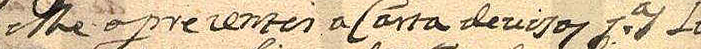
e lhe aprezentei a Carta de uosas s.as Lo
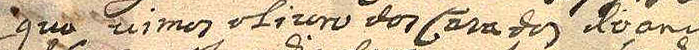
guo uimos o Liuro dos Cazados do ano
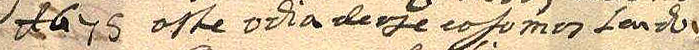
d̄ 675 athe o dia de oje e o fomos lendo
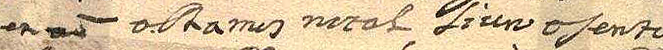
e naõ achamos no tal liuro asento
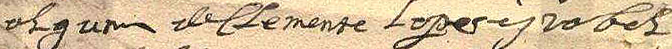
aLgum de CLemente Lopes e jzabeL
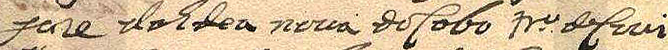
jorie daldea noua do Cabo tr.o de Coui
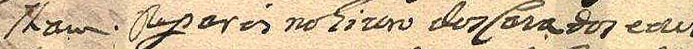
lham. Reparei no liuro dos Cazados e o ui
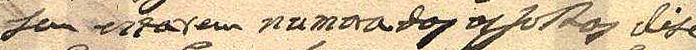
sem estarem numeradas as folhas dise
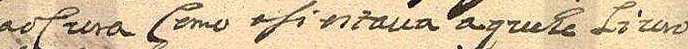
ao Cura Como asi estaua aquele Liuro
